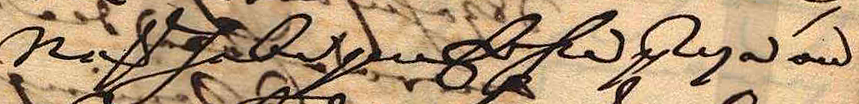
naõ sabe que fosse preza ou
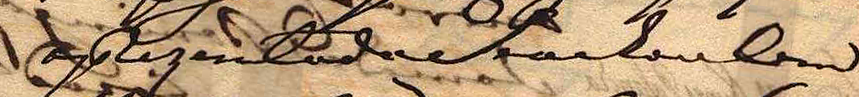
aprezentada se achou Com
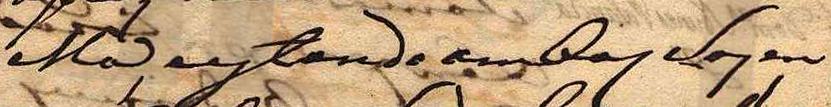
ella, e estando ambas Sos en
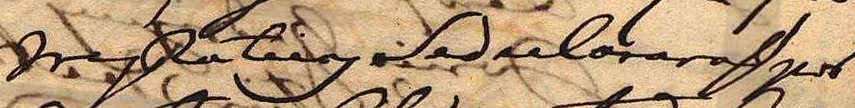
tre pRaticas se declararaõ por
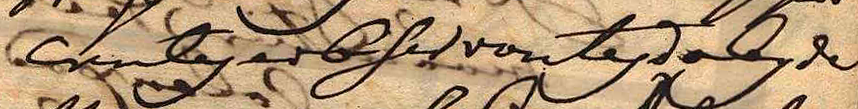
crentes e observantes da Ley de
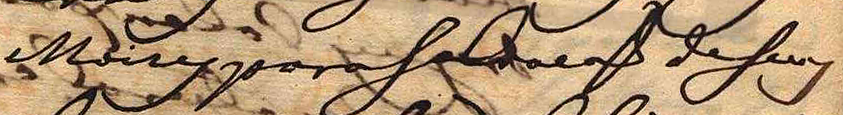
Moizes para salvacaõ de suas
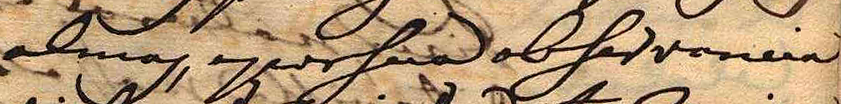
almas, e por sua observancia
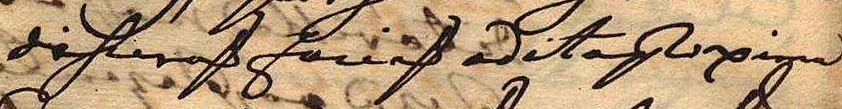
disseraõ faziaõ a dita pRoxima
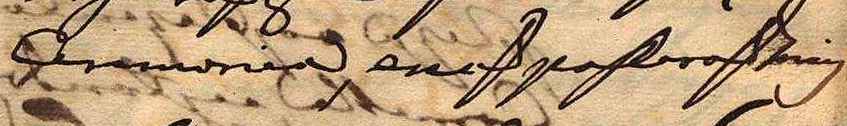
Ceremonia, e naõ passaraõ mais
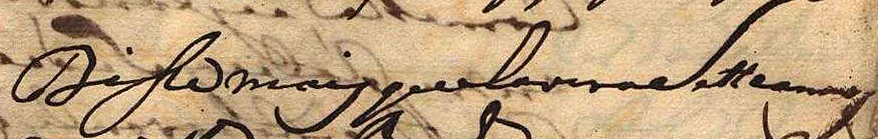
Disse mais que havera sette annos
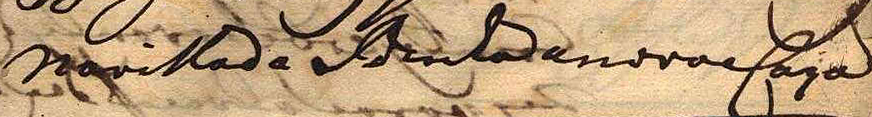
na villa de Idanha a nova e Caza
